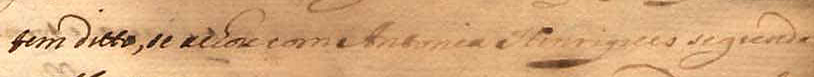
tem ditto, se achou com Antonia Henriques segunda
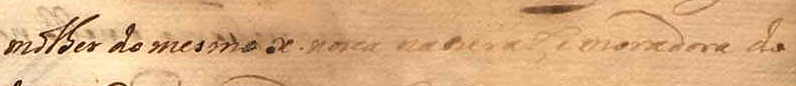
molher do mesmo x. noua natural, e moradora do
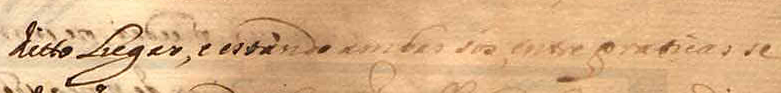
ditto Lugar, e estando ambas sós, entre praticas se
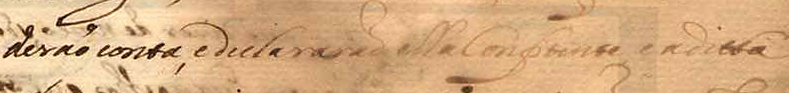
deraõ conta, e declararaõ ella Confitente, e a dita
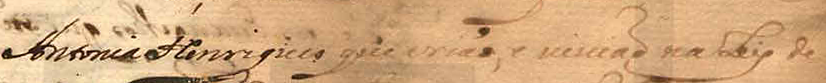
Antonia Henriques que criaõ, e uiuiaõ na Ley de
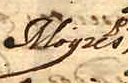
Moyzes
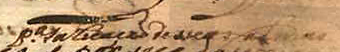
p.a saluaçaõ de suas almas
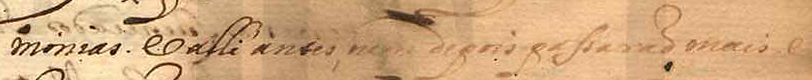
monias. E alli antes, nem depois passaraõ mais e
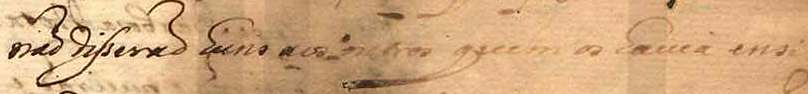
naõ disseraõ huns aos outros quem os hauia ensi
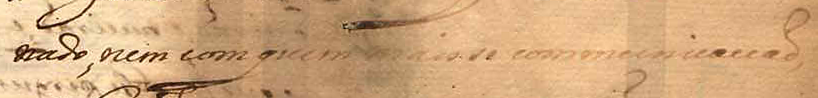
nado, nem com quem mais se communicauaõ,
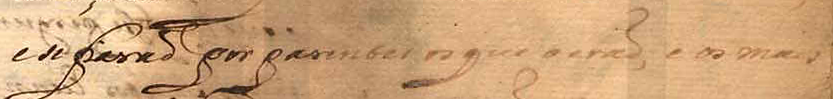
e se fiaraõ por parentes os que o eraõ, e os mais
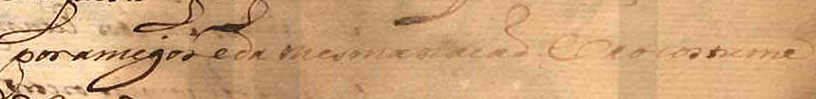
por amigos e da mesma naçaõ. E ao costume
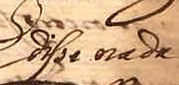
disse nada
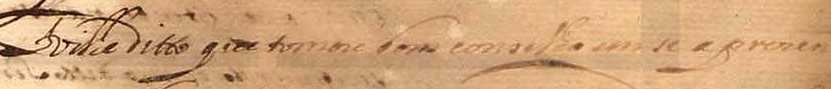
Foilhe ditto que tomou bom conselho em se aprezen
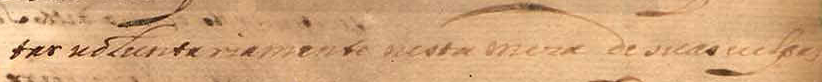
tar uoluntariamente nesta meza de suas culpas
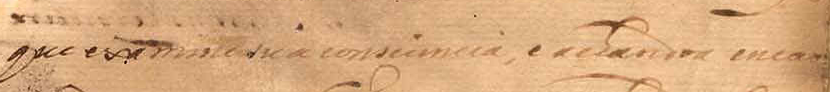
que examine sua consciencia, e achandoa encar
